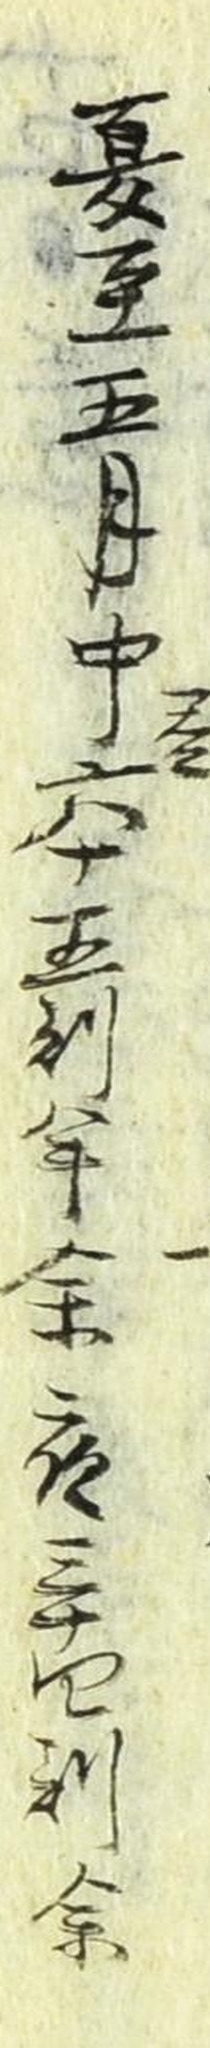夏至五月中昼六十五刻半余夜三十四刻余
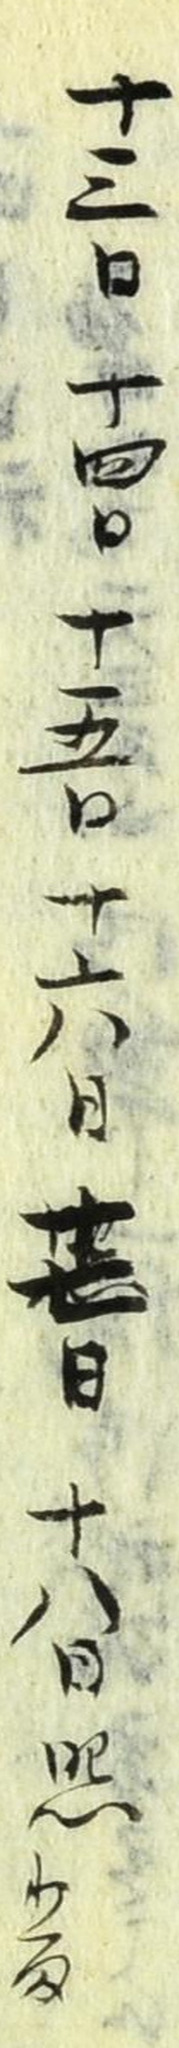十三日十四日十五日十六日十七日十八日照少雨
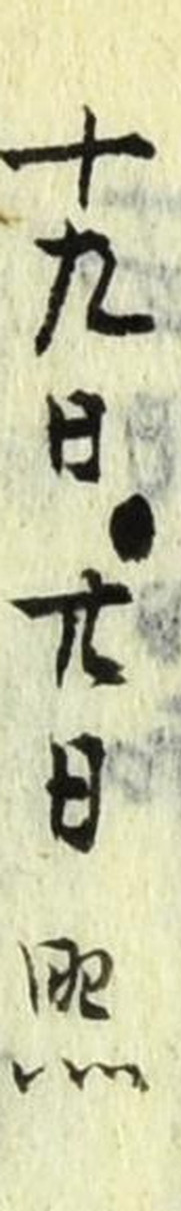十九日●廿日照
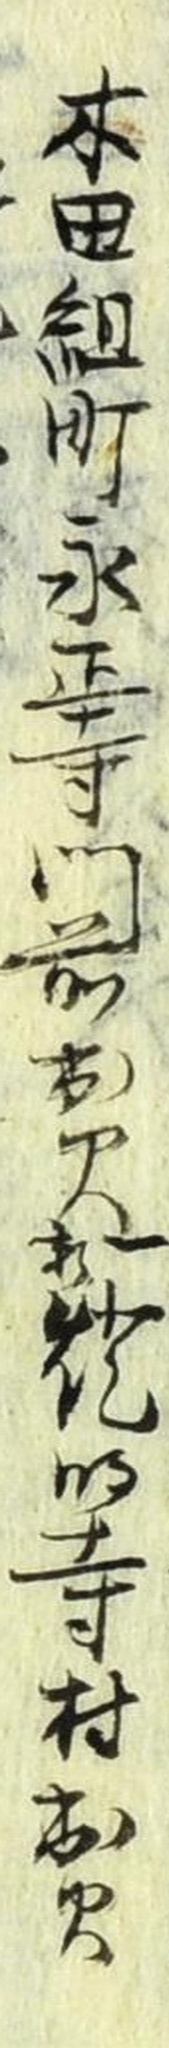木田組町永正寺門前出火一軒焼明寺村出火
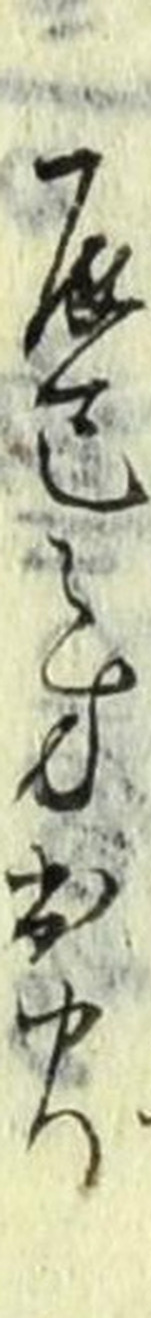辰巳之方出火
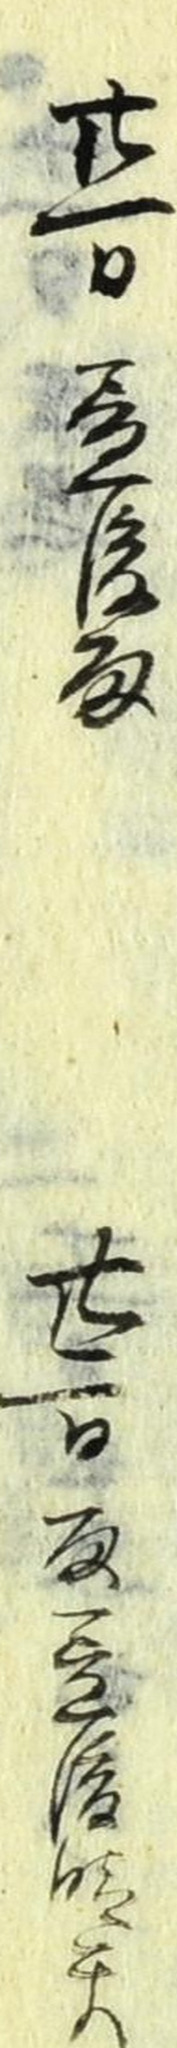廿一日昼後雨廿二日雨昼後晴天
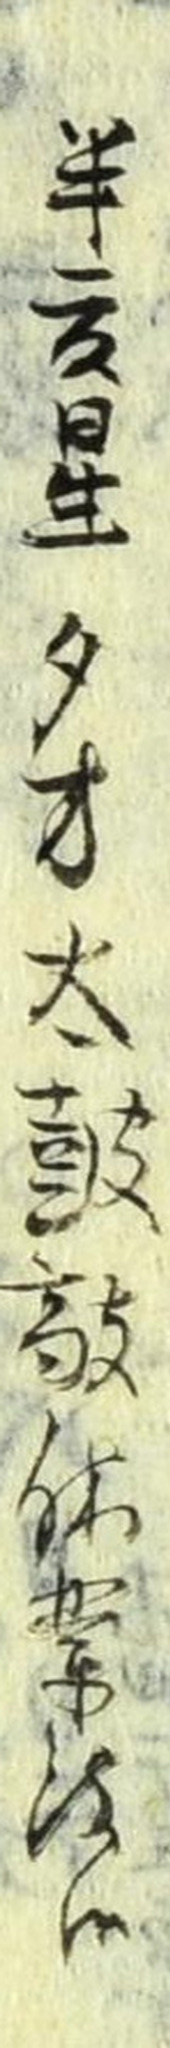半夏星夕方太鼓敲休業致候
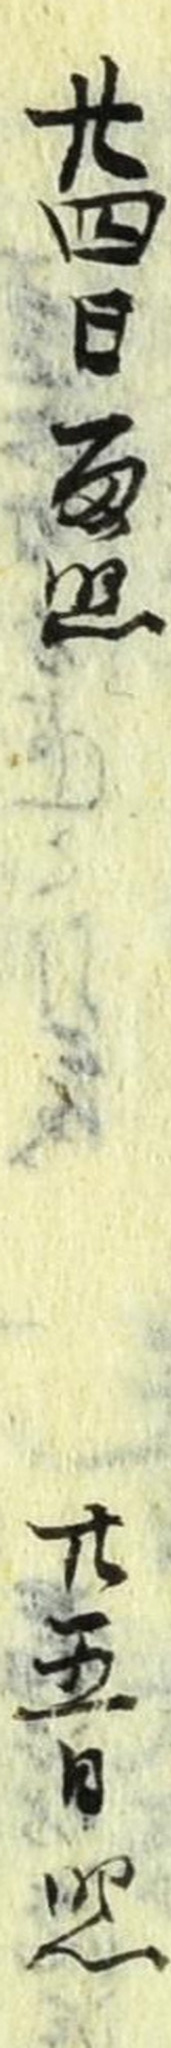廿四日雨照廿五日照
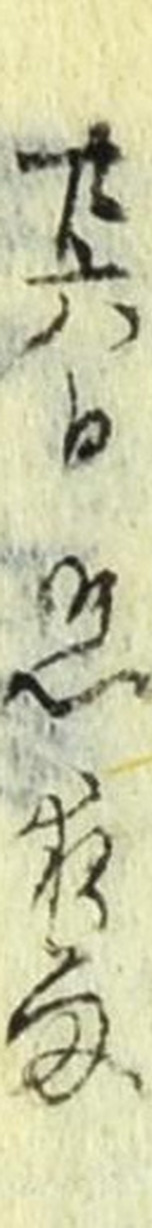廿六日照夜雨
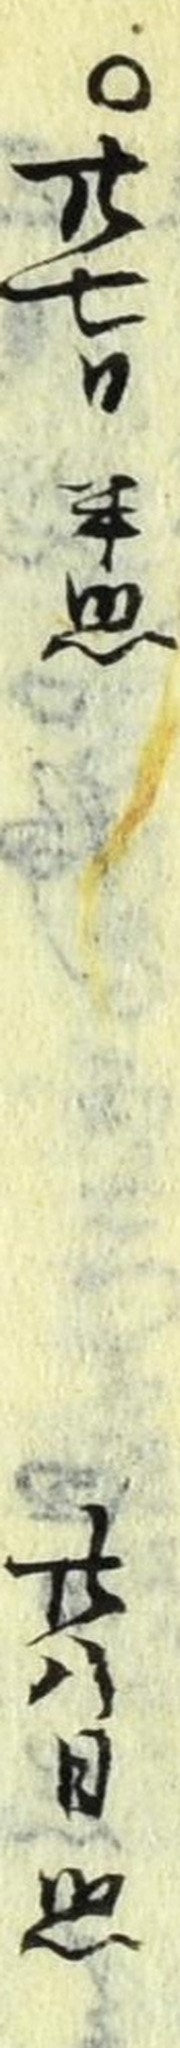○廿七日半照廿八日照
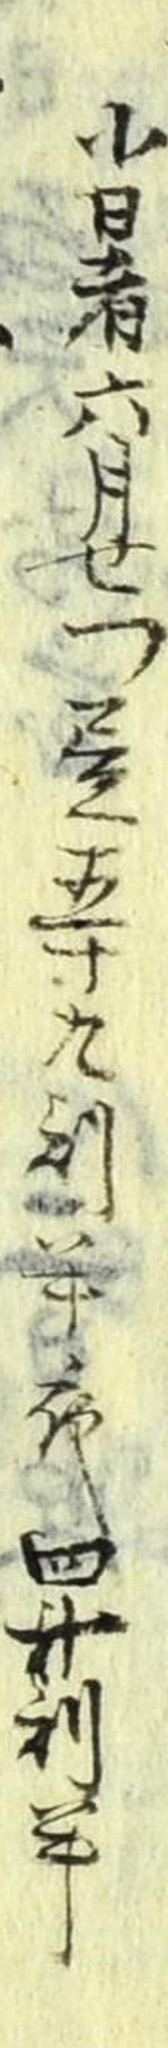小暑六月せつ昼五十九刻半夜四十刻半
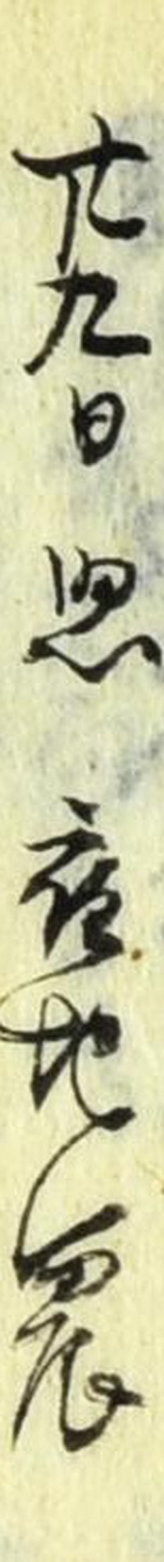廿九日照夜地震
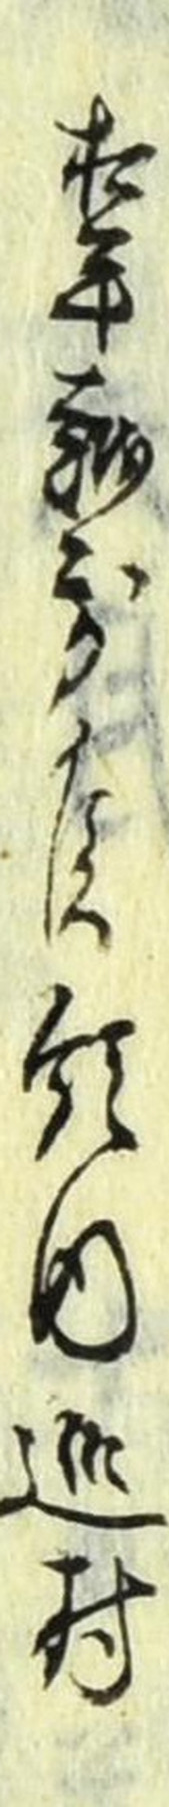松平越前侯領内巡村

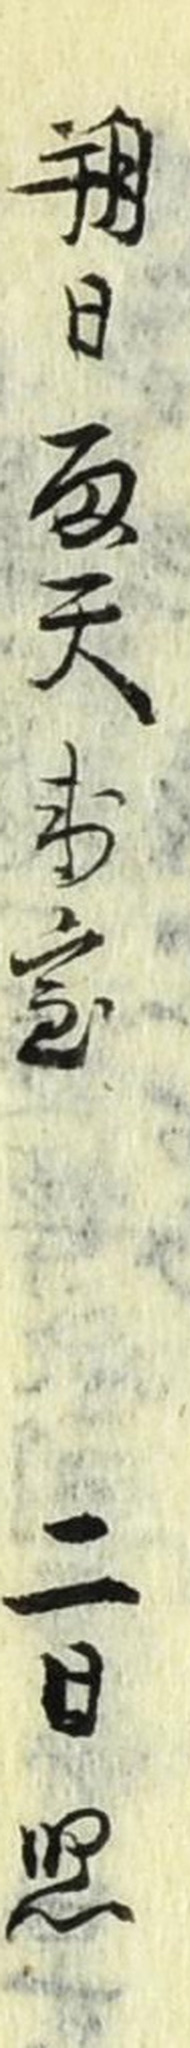朔日雨天氷室二日照
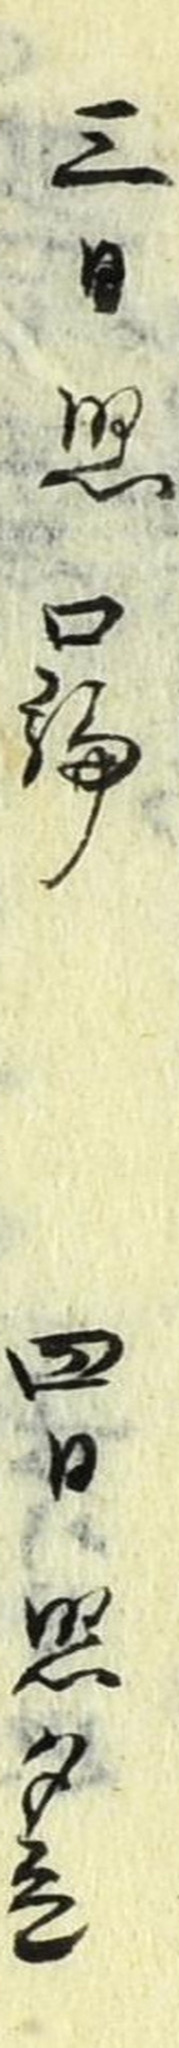三日照口論四日照夕立
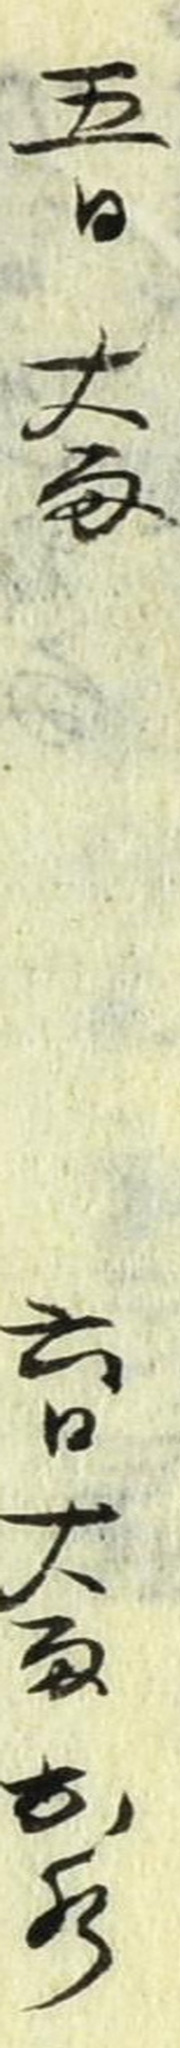五日大雨六日大雨出水
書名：（日記）
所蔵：福井県文書館 Fukui Prefectural Archives
